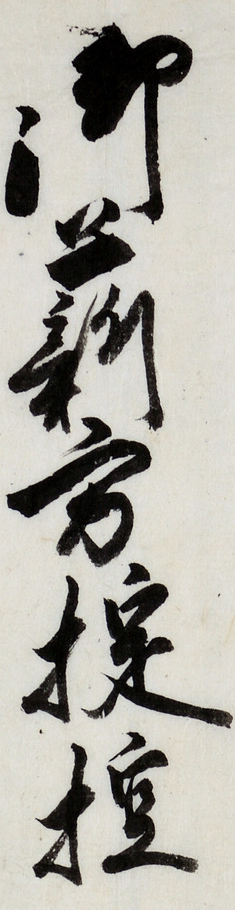御薪方掟控

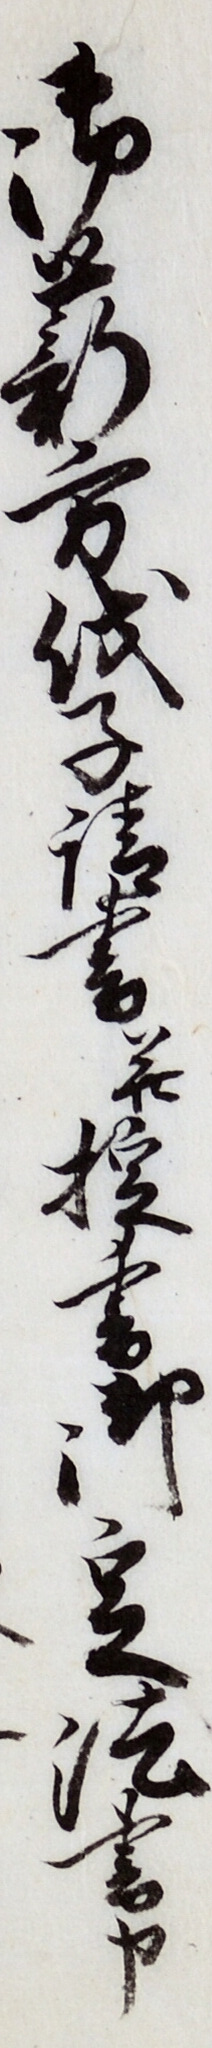御薪方伐子請書并掟書御定法書申
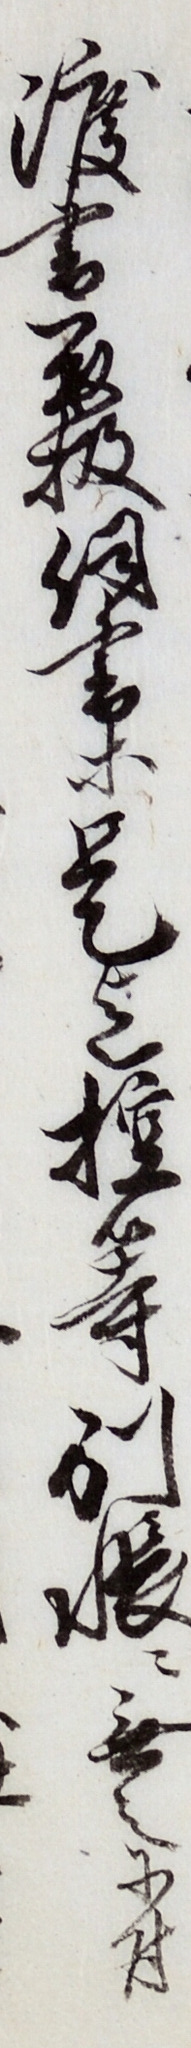渡書取扱伺書等是迄控等別帳ニ無之に付
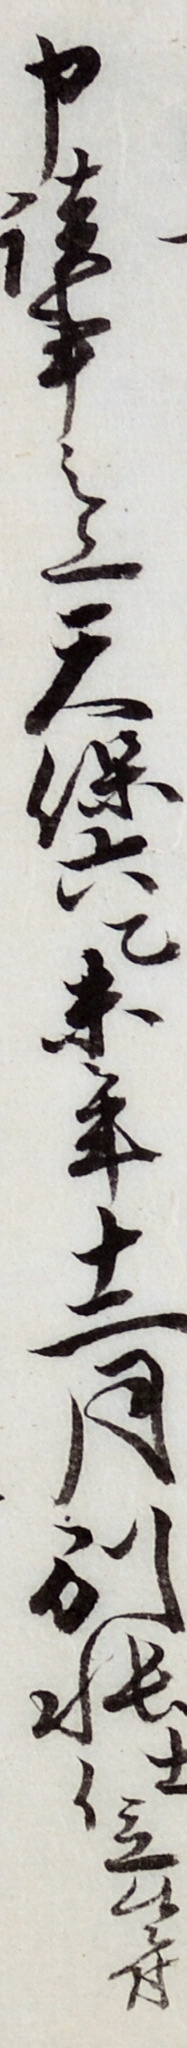申請事之上天保六乙未十二月別帳仕立候ニ付
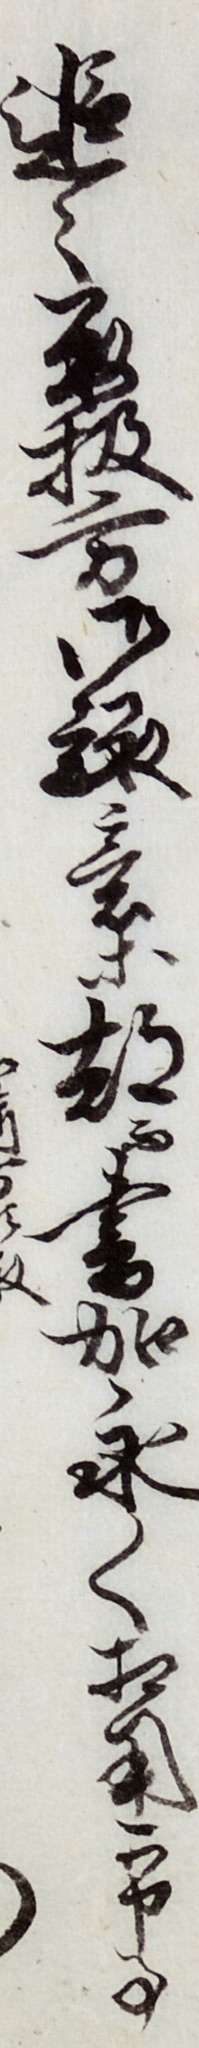追々取扱方御趣意等都而書加永く相用可申事
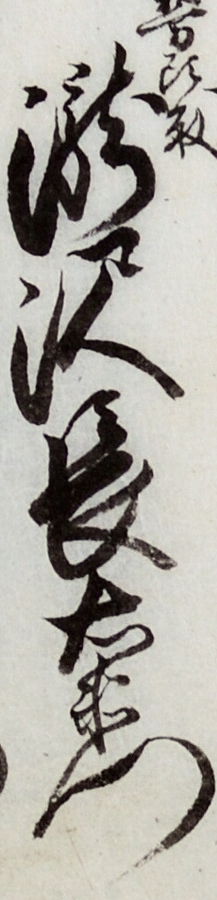瀧沢長右衛門
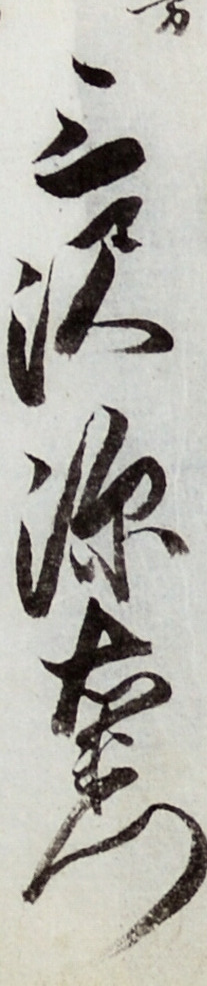三沢源右衛門
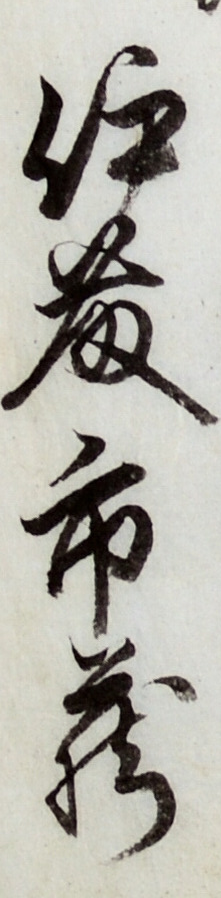伊藤市蔵

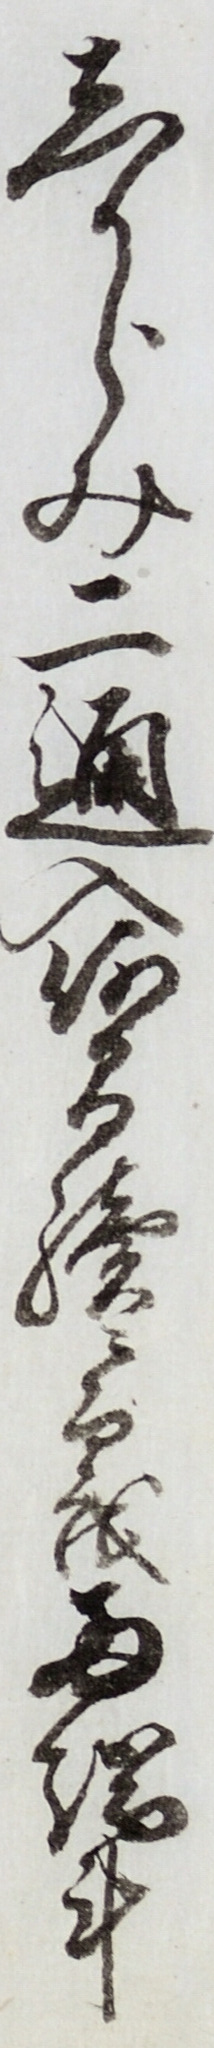しからみ二通入何間続ニ而茂両端計
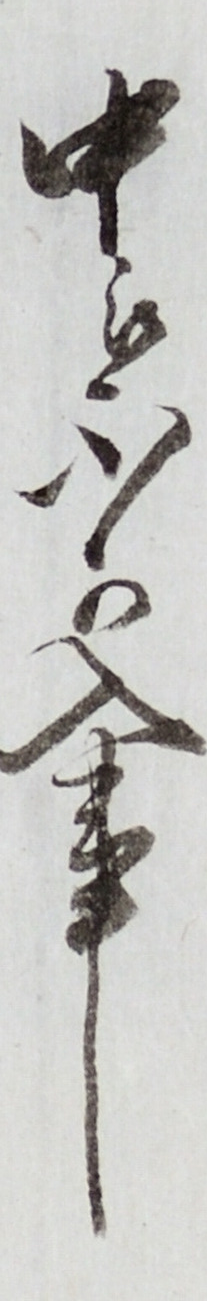中江不可入り事
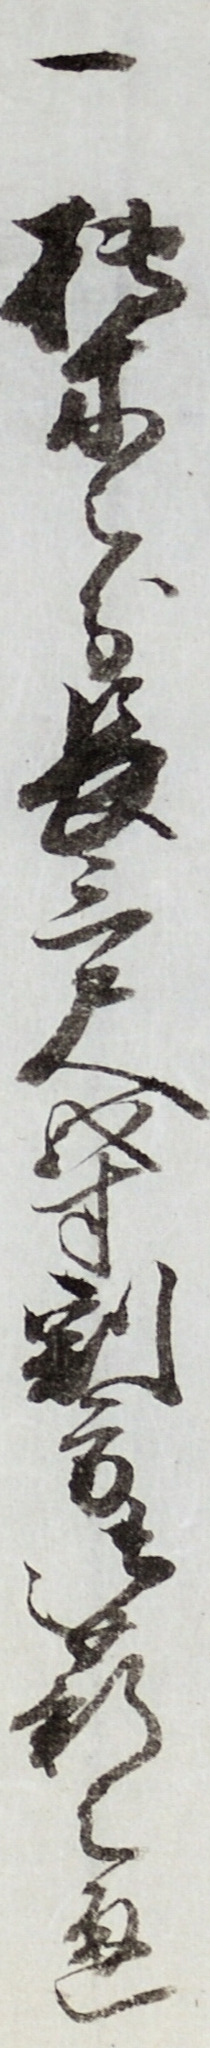一樽木之分長三尺弐寸割方御薪之通
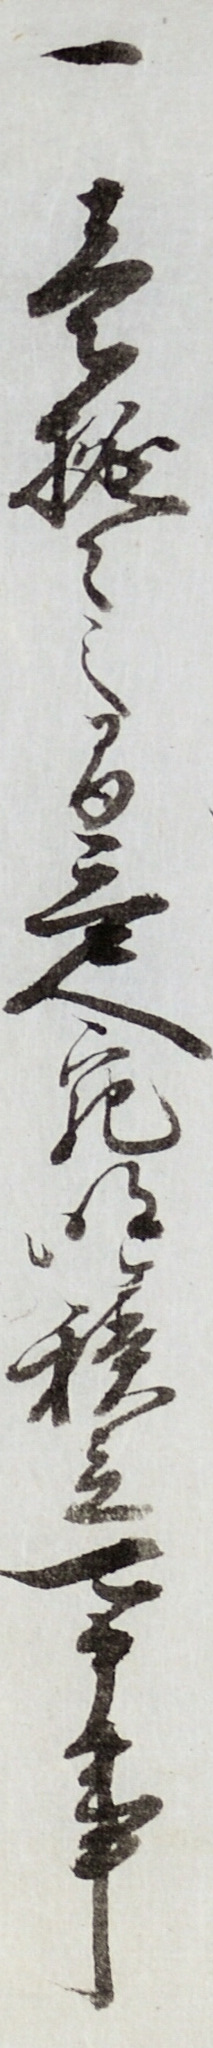一壱挺々之間三尺宛開け明ヶ積立可申事
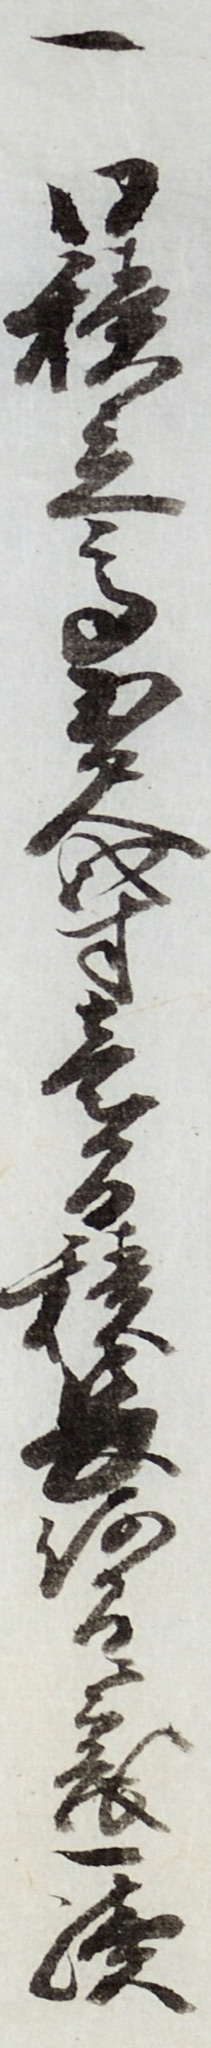一同積立高五尺弐寸壱間積長何間ニ而茂一続
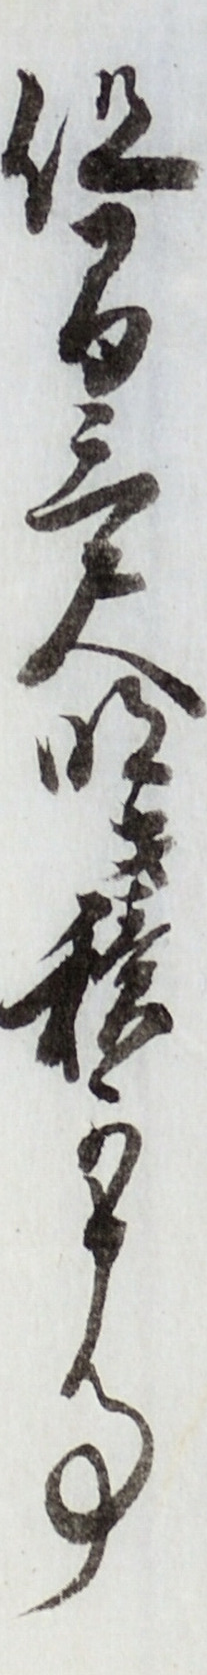但間三尺明キ積可申事
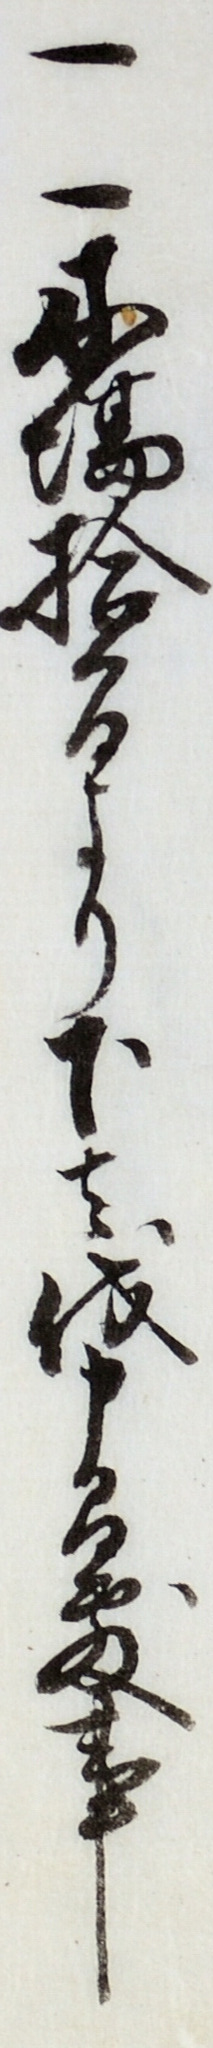一一木場拾間より下者伐申間敷事
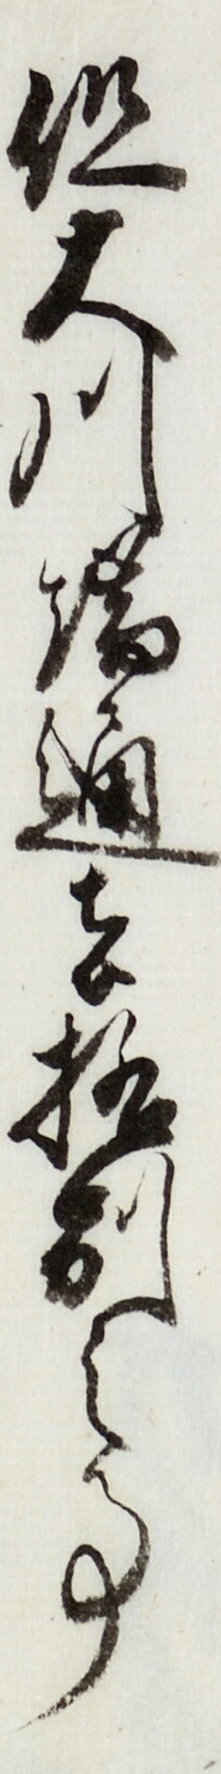但大川端通者格別之事
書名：御薪方掟控
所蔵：伊那市立高遠町図書館・合同会社AMANE
